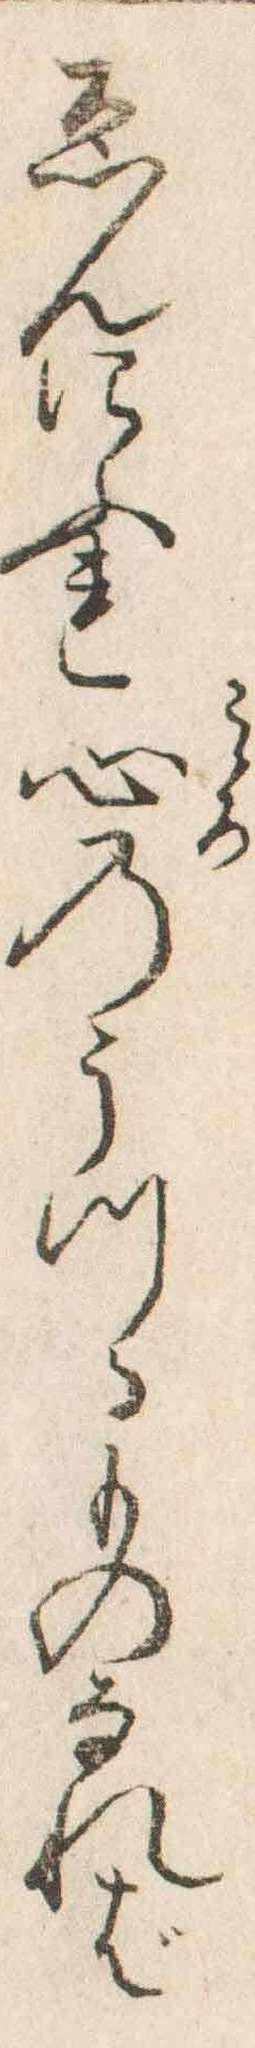ゑんにふれ心のうつるものなれば
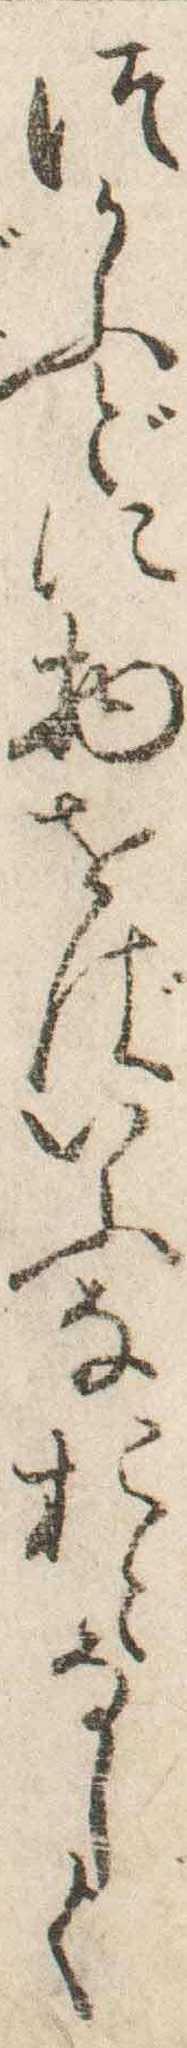つかふどに物をばいふなおとなしく
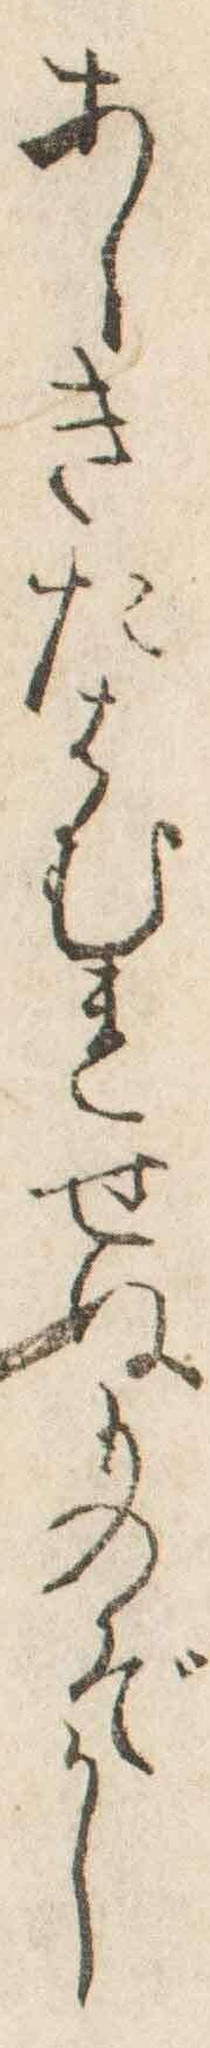あしきたはむれせぬものぞかし
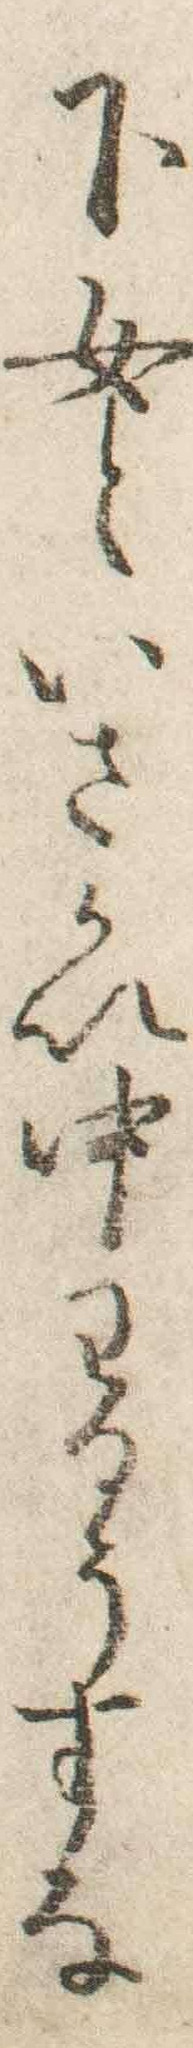下女といさかい中わるうすな
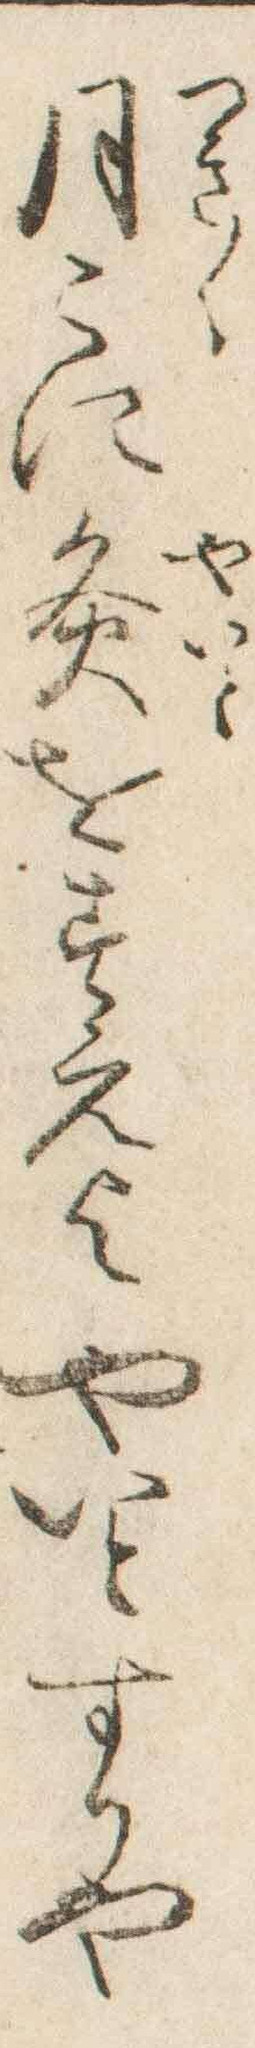月々に灸をすえよやいとすりや
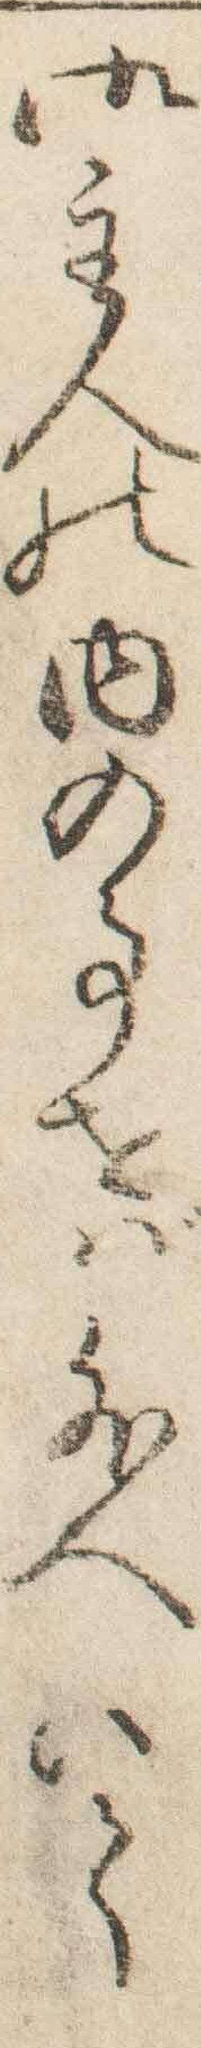御主人の内の事をば外へいて
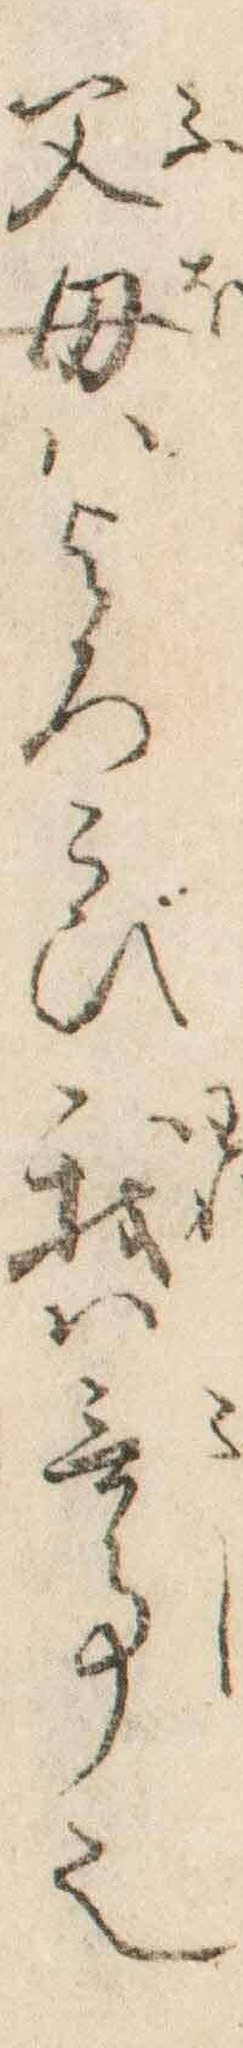父母はよろこび我は無事也
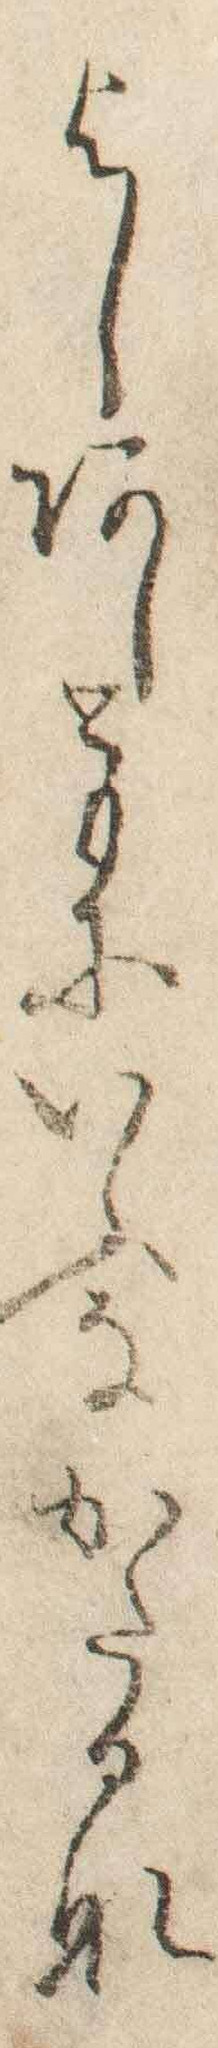よしあしともにいふなかたるな

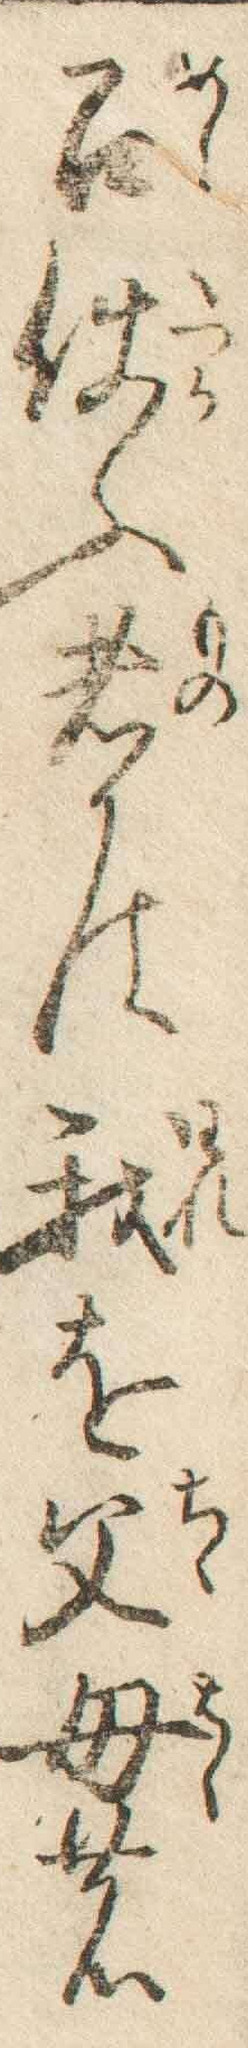召使ふ者かは我を父母の
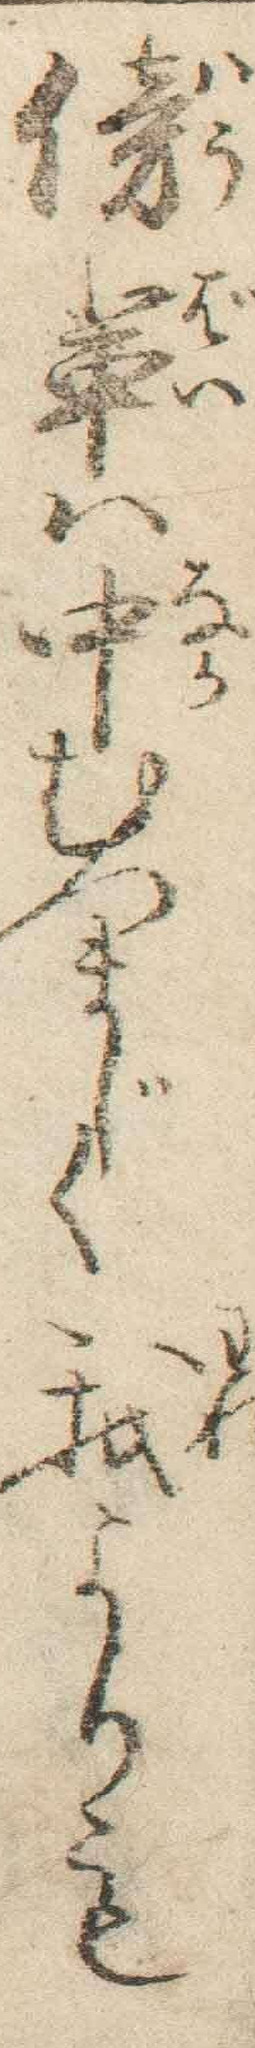傍輩は中むつまじく我よりも
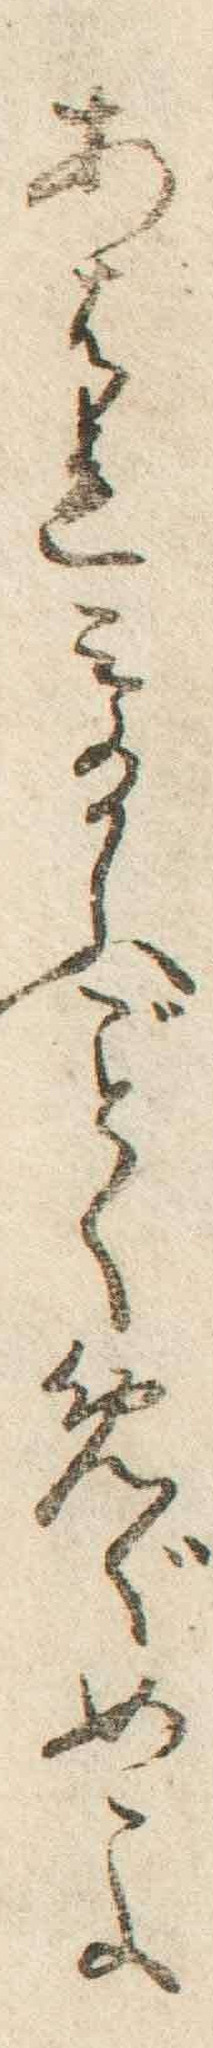あはれみ給ふごとくめぐめよ
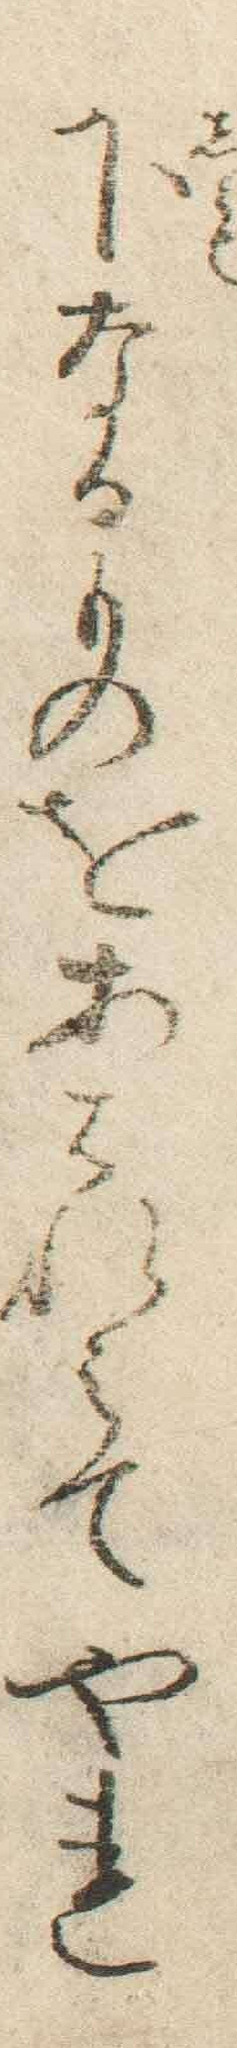下なるものをあはれみてやれ
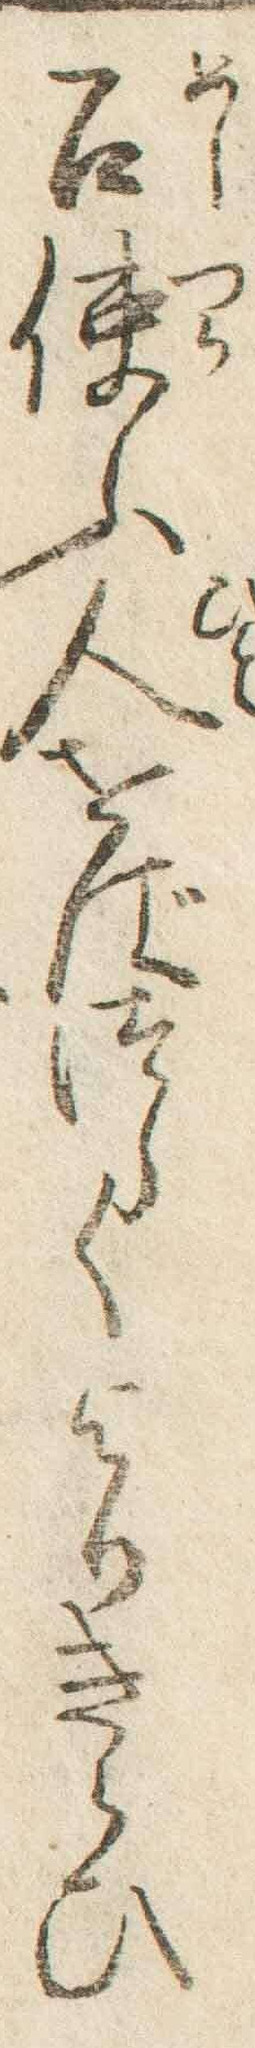召使ふ人をばつらくよりきらひ
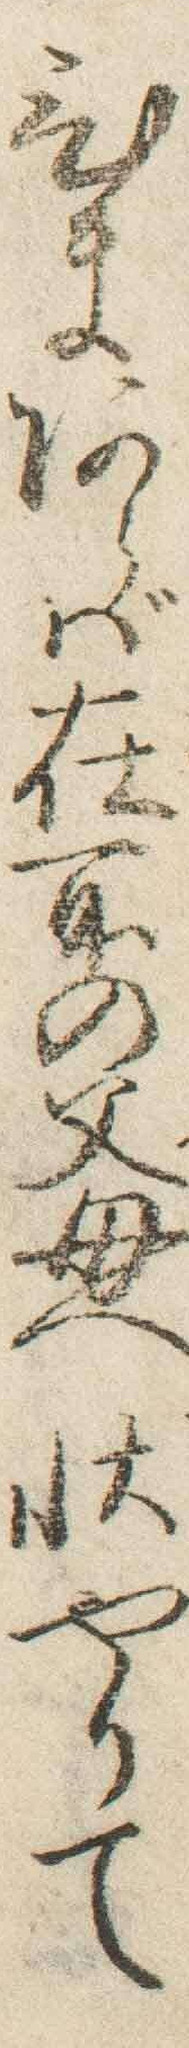ひまあらば在所の父母へ状やりて
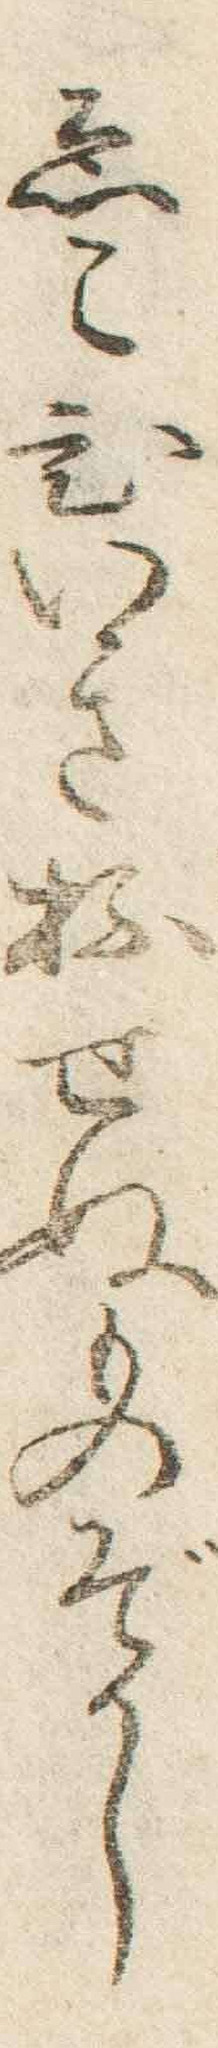ゑこひいき抔せぬものぞかし
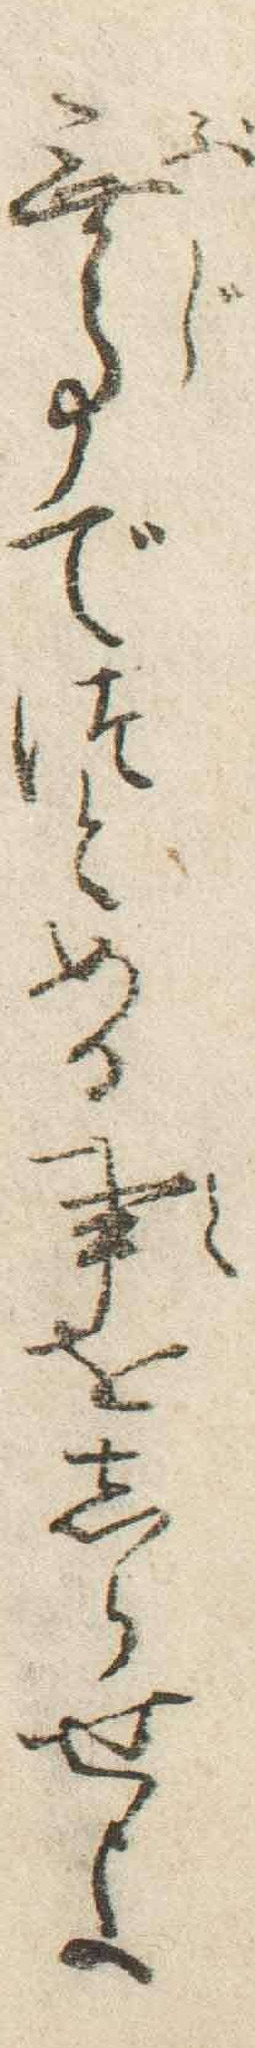無事でつとめる事をしらせよ
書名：撫育草
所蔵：東京学芸大学附属図書館 国文学研究資料館
